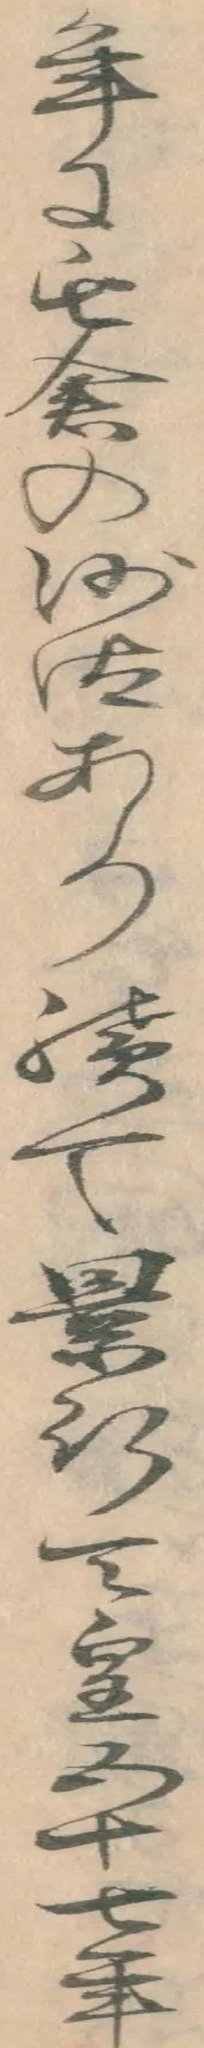年に屯倉の沙汰あり続て景行天皇五十七年
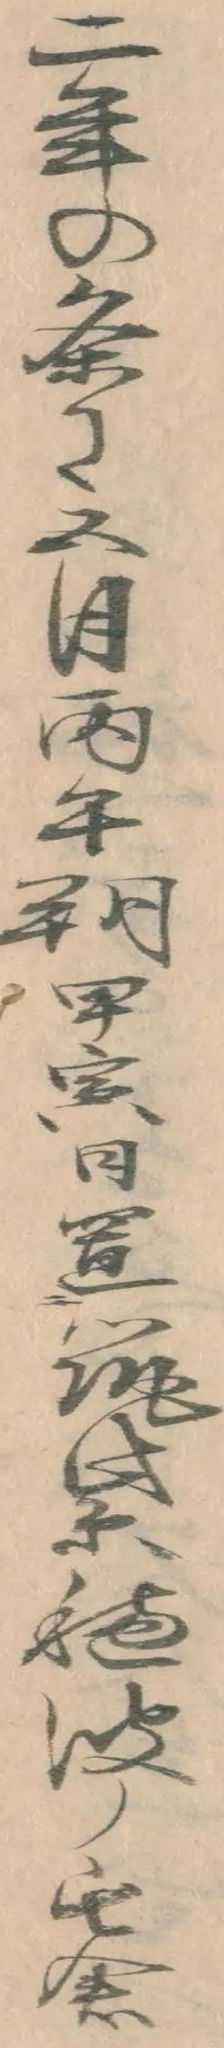二年の条に五月丙午朔甲寅日置筑紫穂波ノ屯倉
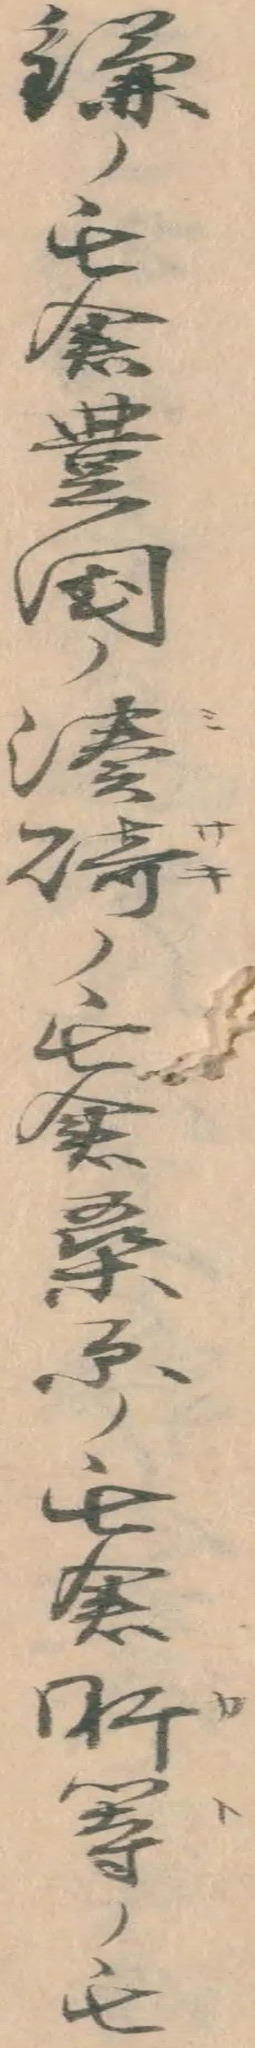鎌ノ屯倉豊国ノ湊崎ノ屯倉桑原ノ屯倉肝等ノ屯
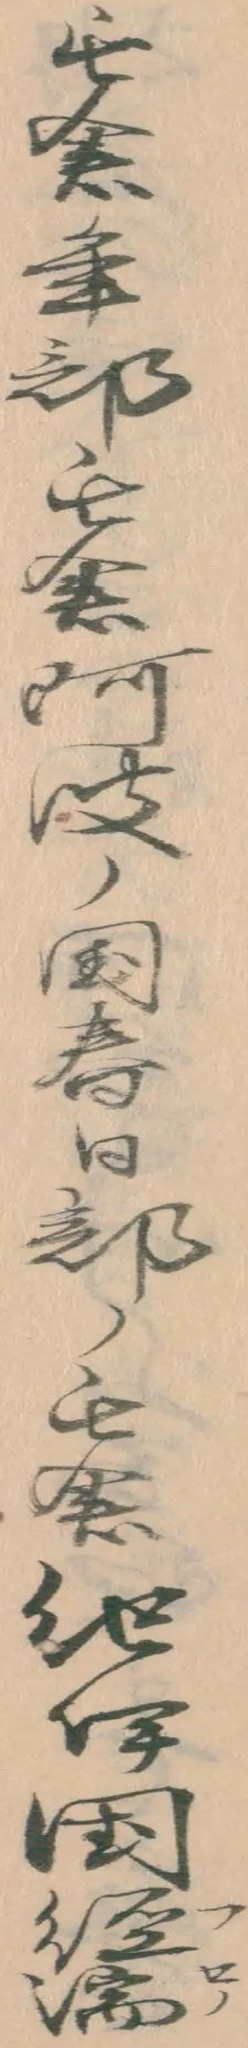屯倉年部年屯倉阿波ノ国春日部ノ屯倉紀伊国 経湍
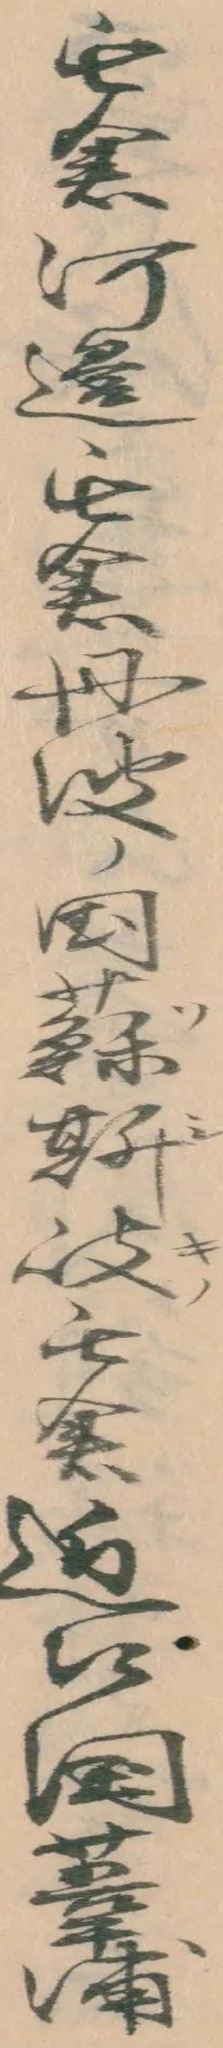屯倉河辺屯倉丹波ノ国蘇斯岐屯倉近江国葦浦
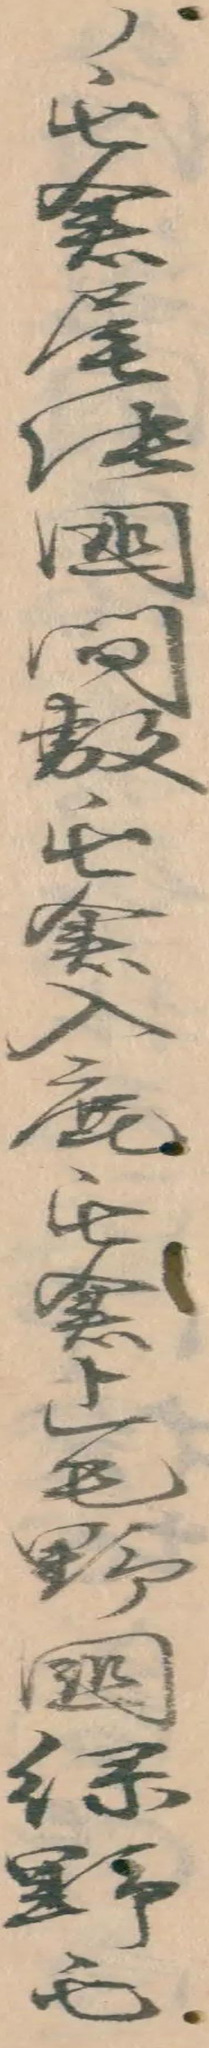ノ屯倉尾張国間敷屯倉入鹿屯倉上毛野国緑野屯
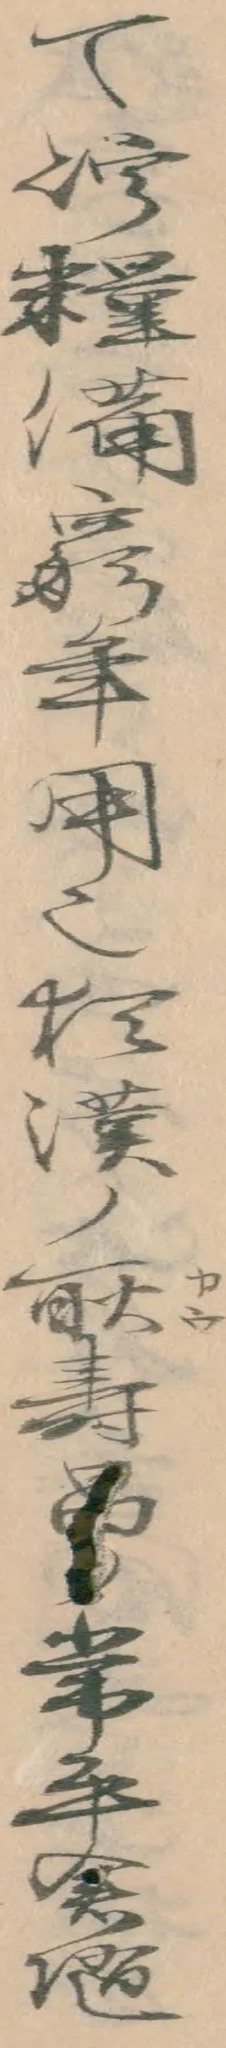て貯糧備窮年用也猶漢ノ耿寿昌ノ常平倉随
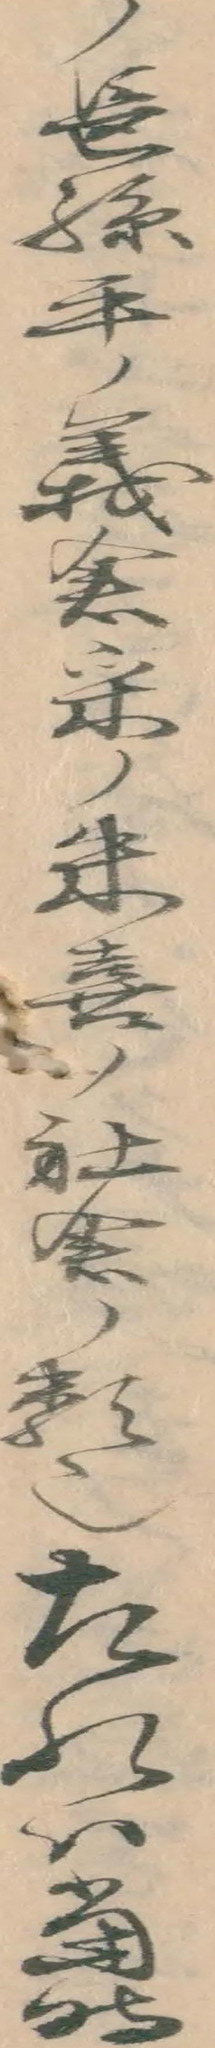ノ長孫平ノ義倉采ノ朱喜ノ社倉ノ類也左れは当時
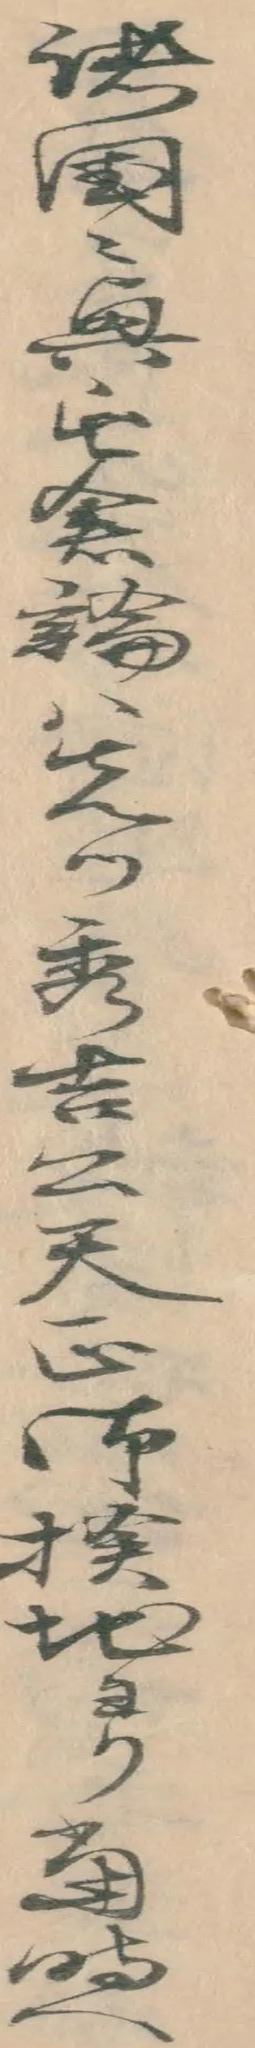諸国に興屯倉論は先つ秀吉公天正御撿地より当時へ
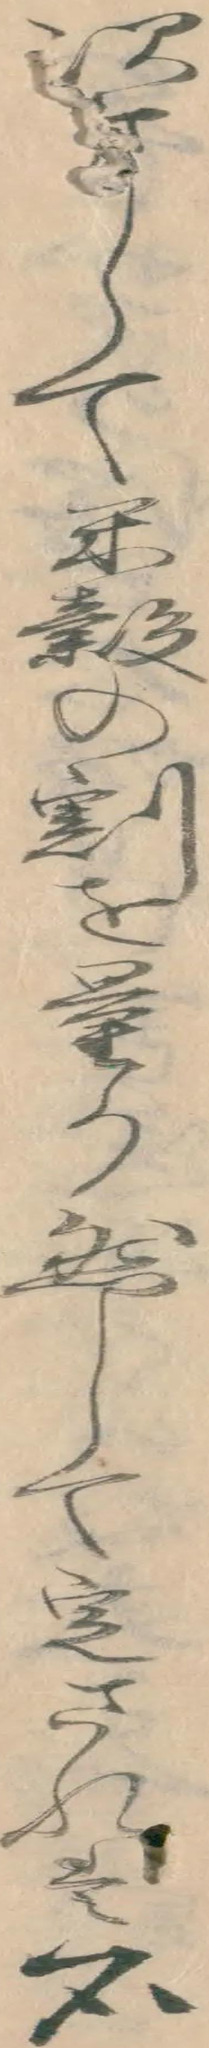して米穀の割を量り然して定されは不
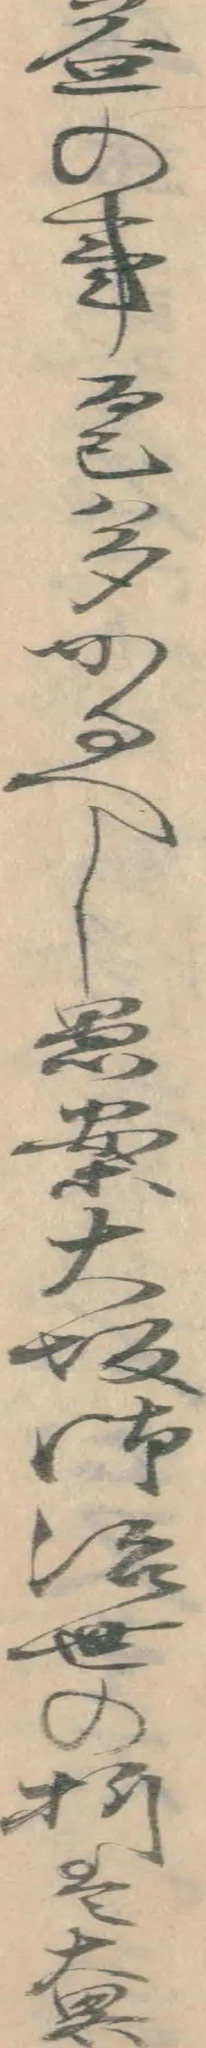益の事而已多かるへし愚案大坂御治世の折は大略
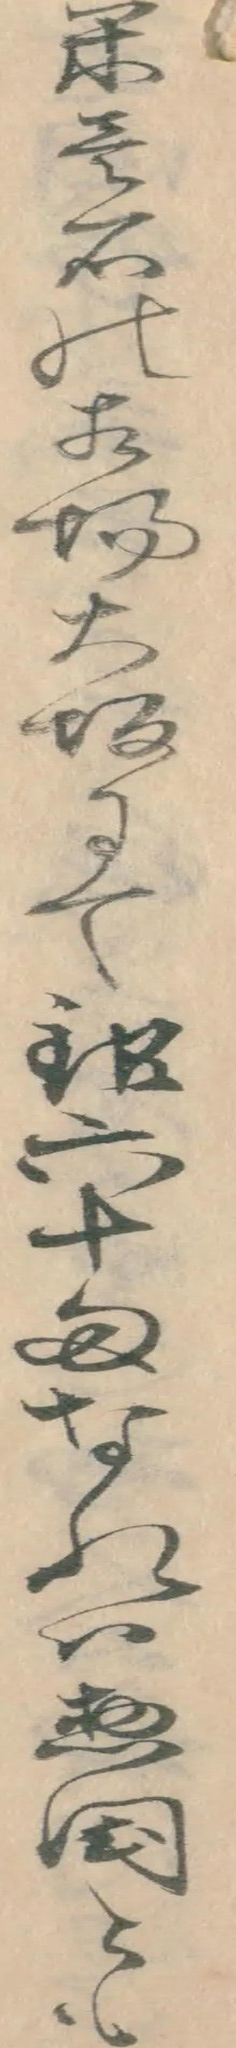米壱石の相場大坂にて銀六十匁なれは惣国とも
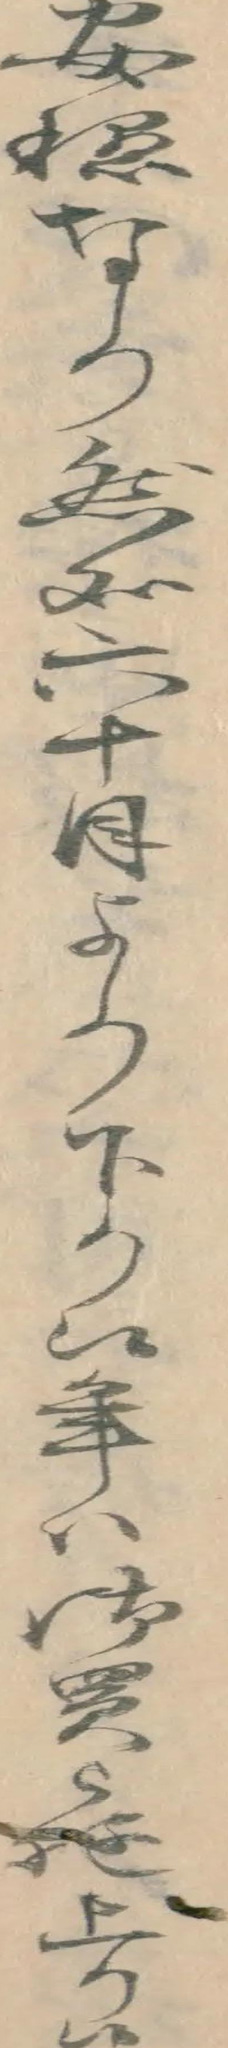安穏なり然処六十目より下り候年は御買被遊上り候

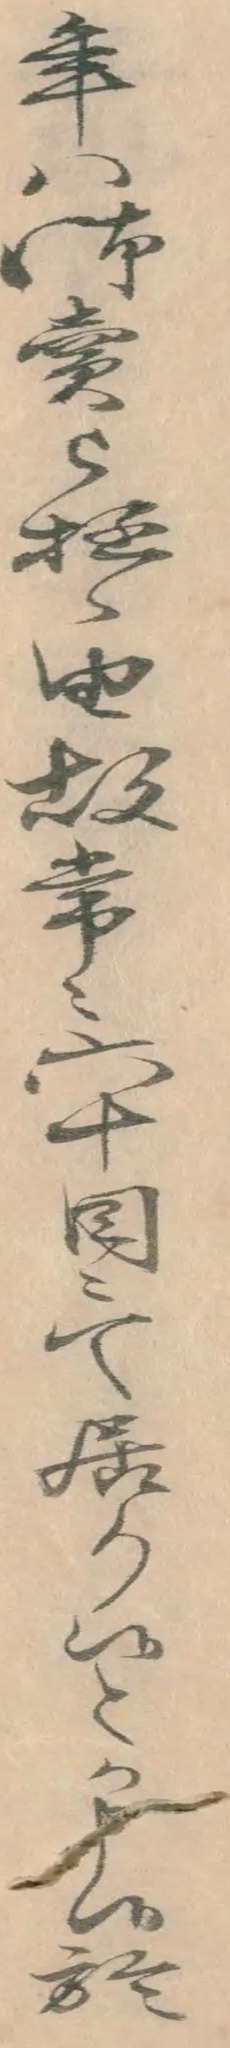年は御売被遊候由故常々六十目にて居り候とか申候於
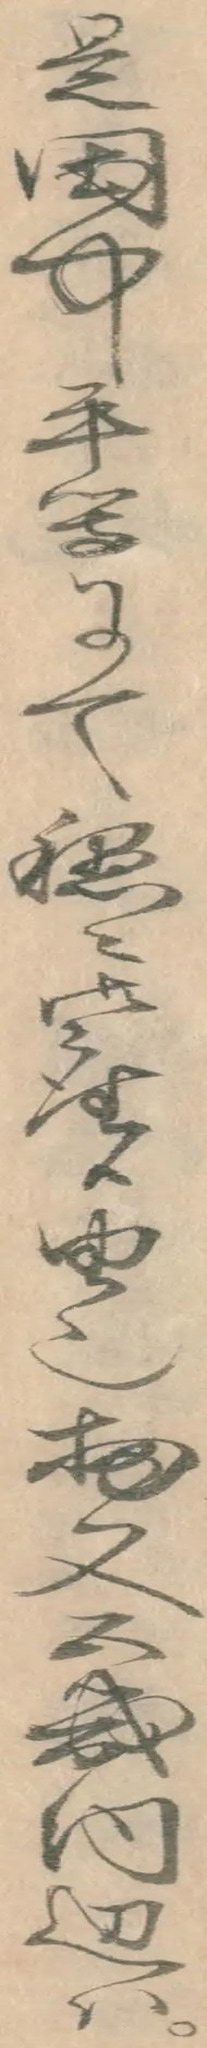是国中平等にて穏に御座候由也扨又五畿内辺は°
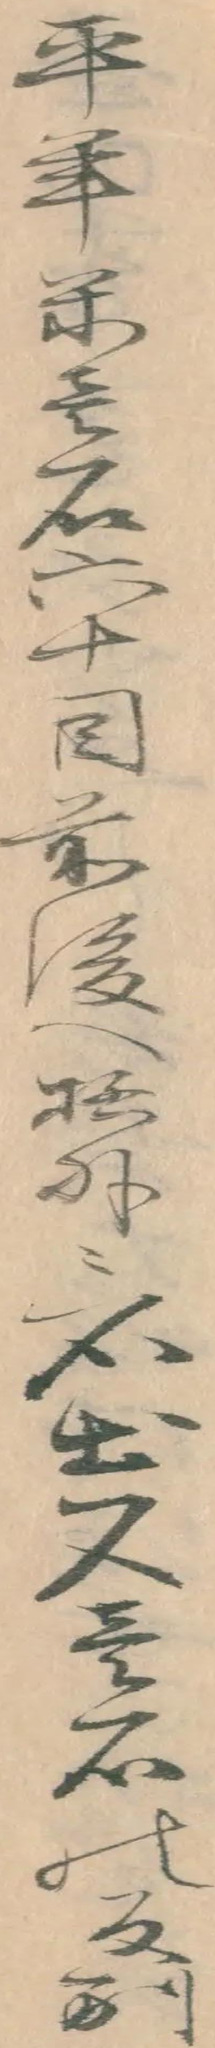平年米壱石六十目前後へ格外に不出又壱石の反別
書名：斎庭之穂
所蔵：国立国会図書館 National Diet Library, JAPAN
